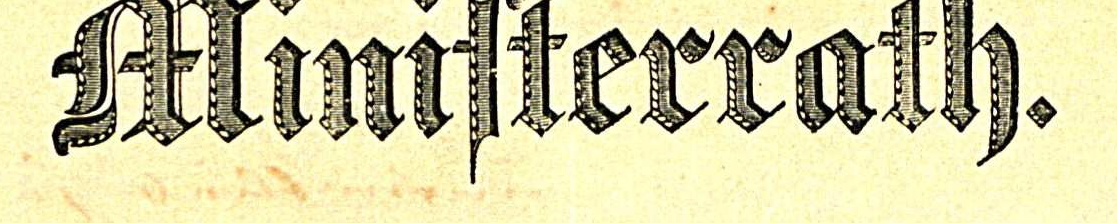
Ministerrath
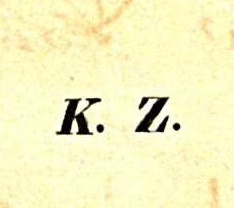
K.Z.
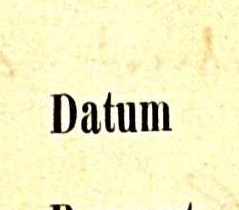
Datum
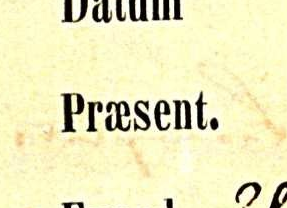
Praesent.
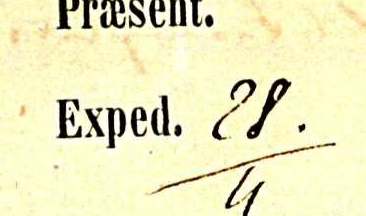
Exped. 28
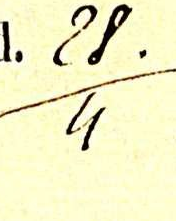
4
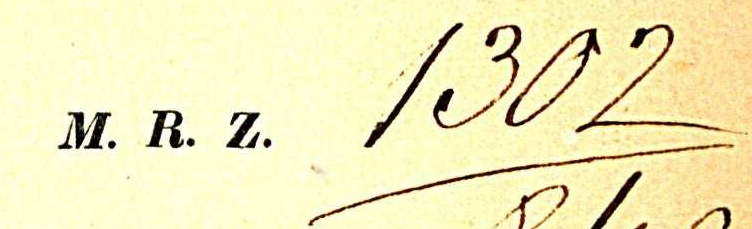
MRZ 1302
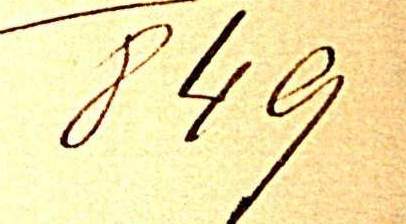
849
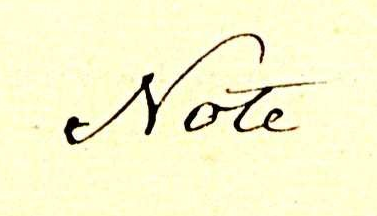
Note
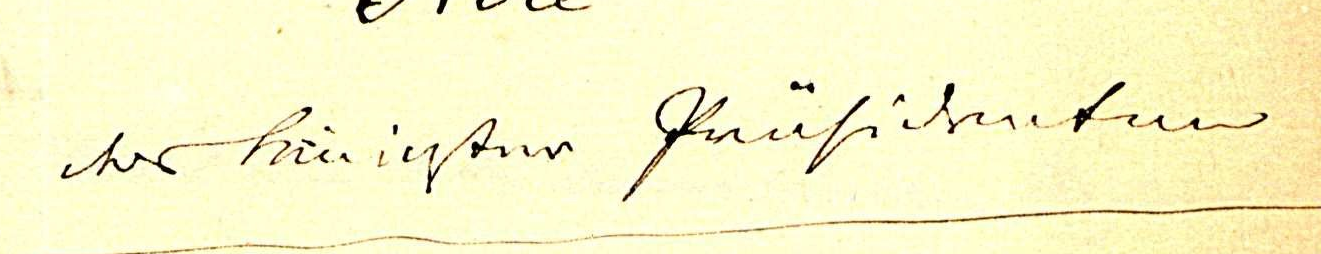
Des Minister Präsidenten
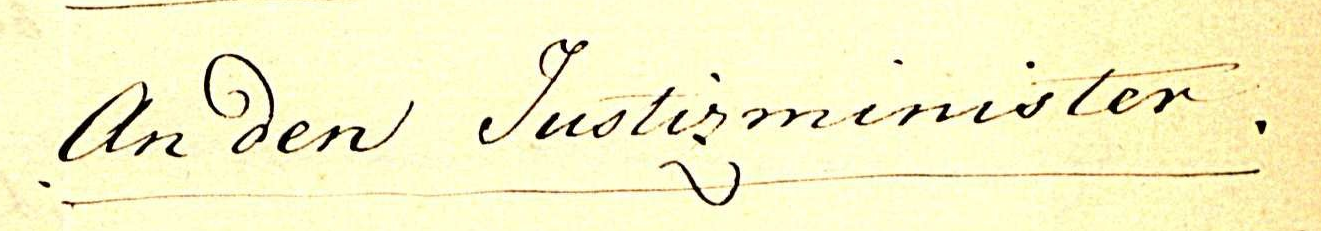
An den Justizminister
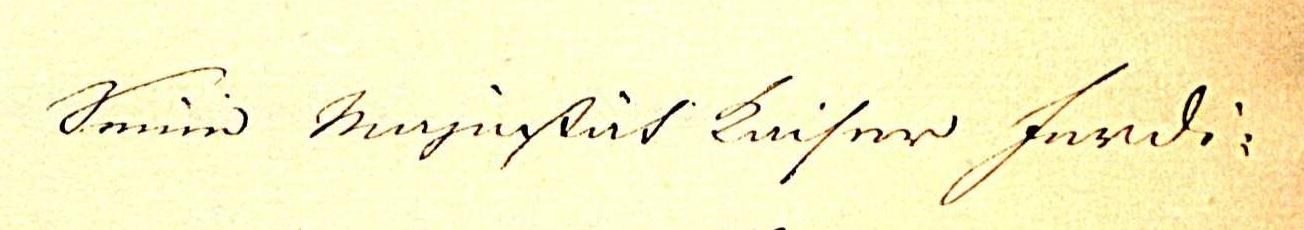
Seine Majestät Kaiser Ferdi¬
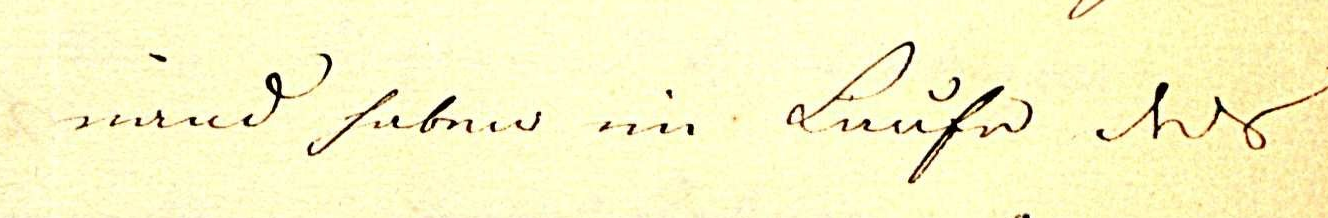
nand haben im Laufe des
